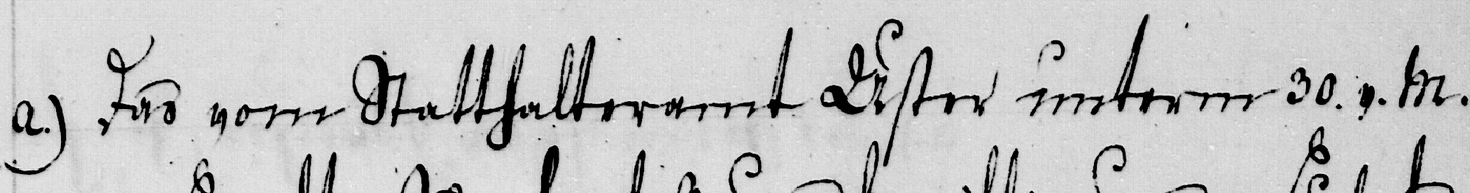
a.) Das vom Statthalteramt Uster unterm 30. v. M.
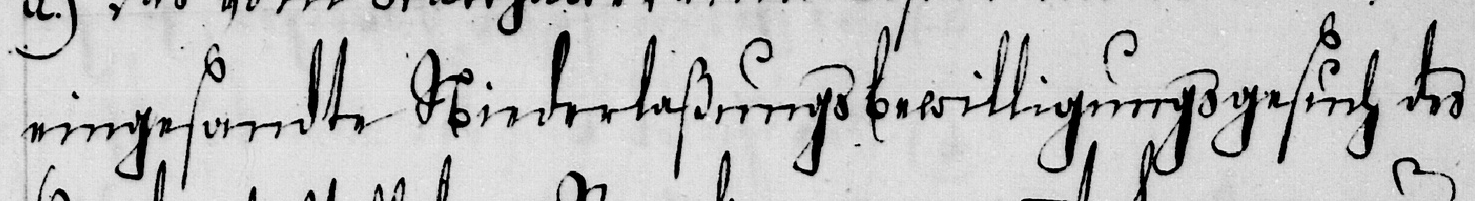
eingesandte Niederlaßungsbewilligungsgesuch des
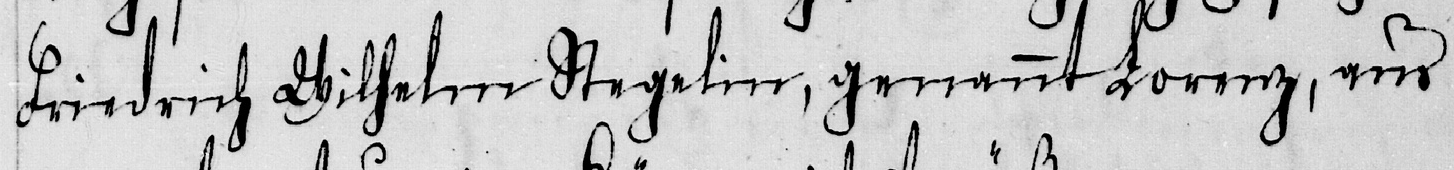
Friedrich Wilhelm Stegelin, genannt Lorenz, aus
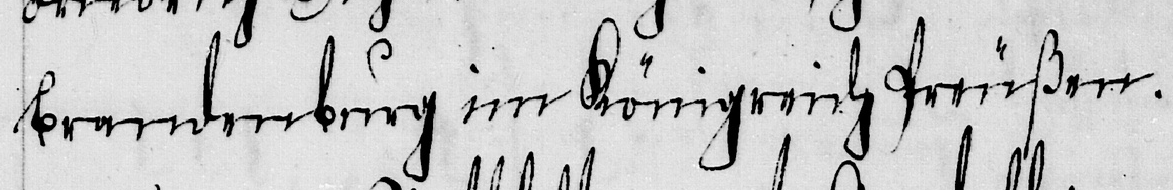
Brandenburg im Königreich Preußen.
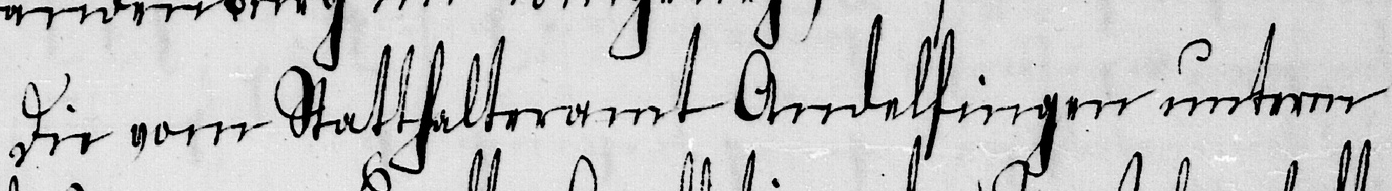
Die vom Statthalteramt Andelfingen unterm
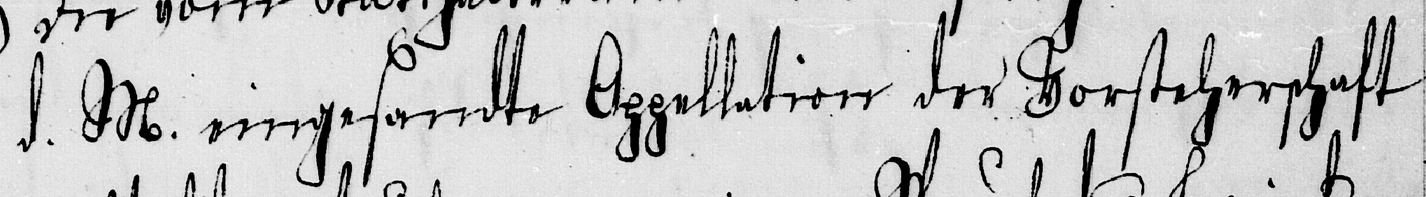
d. M. eingesandte Appellation der Vorsteherschaft
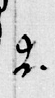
2.
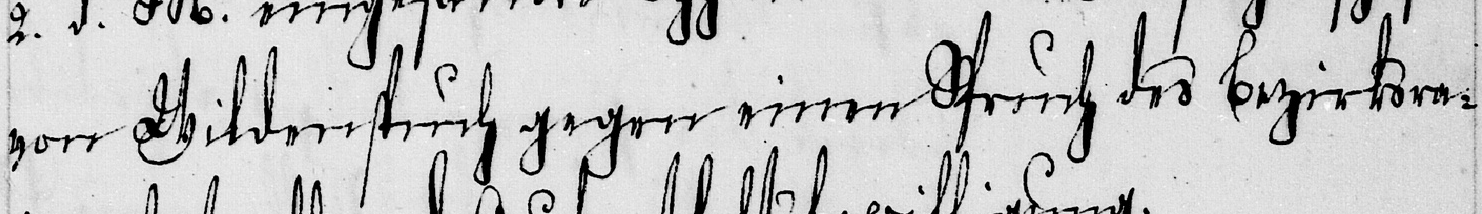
von Wildenspuch gegen einen Spruch des Bezirksra¬
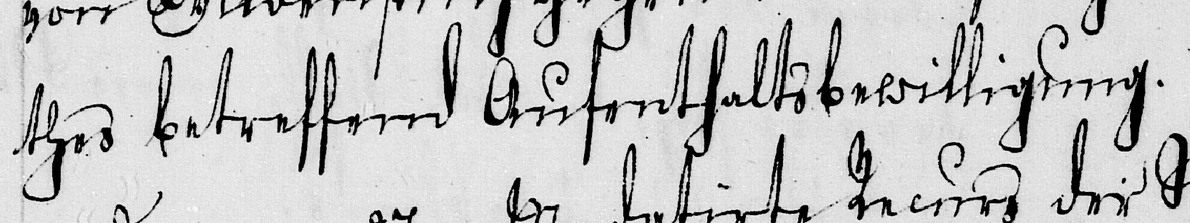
thes betreffend Aufenthaltsbewilligung.
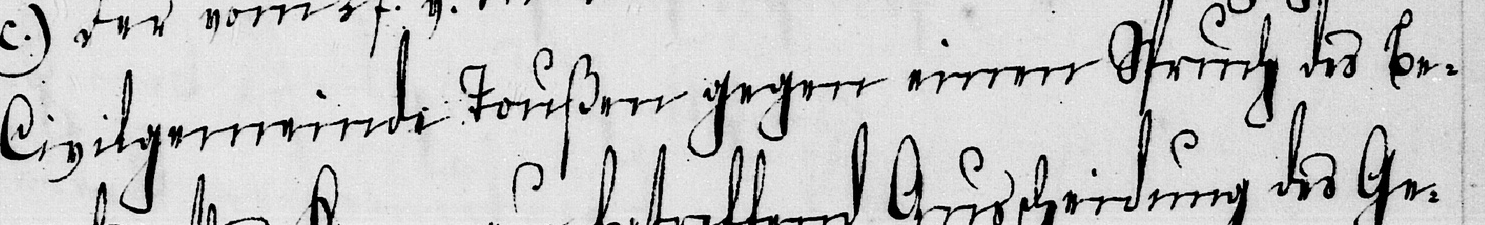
Civilgemeinde Toußen gegen einen Spruch des Be¬
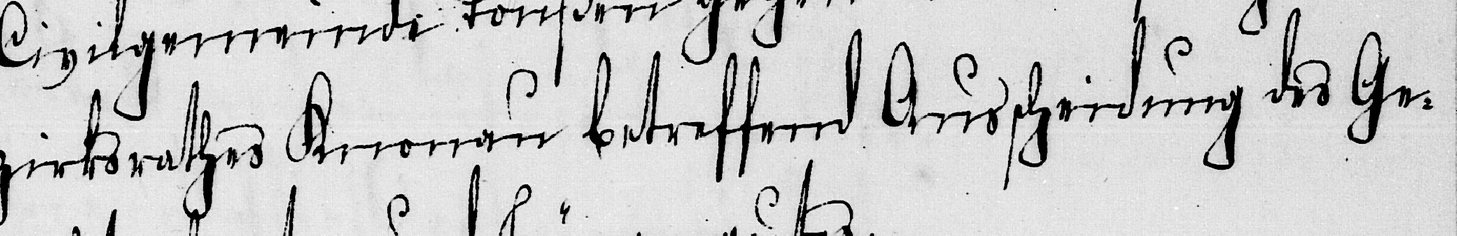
zirksrathes Knonau betreffend Ausscheidung des Ge¬
